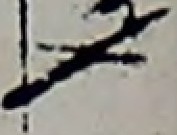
7
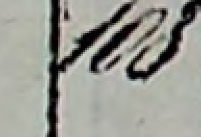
108
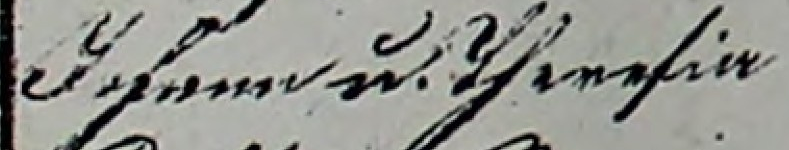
Johann u. Theresia
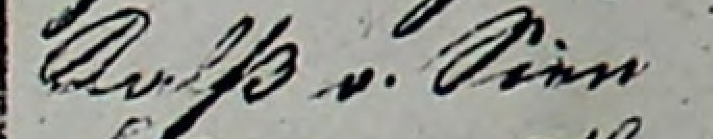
Kalß v. Sien
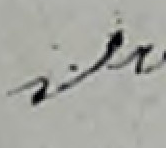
do
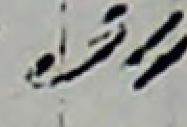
34
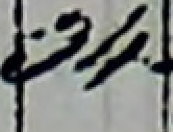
34
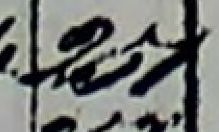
251
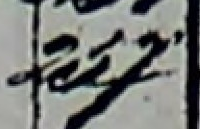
257
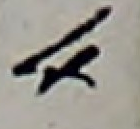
4
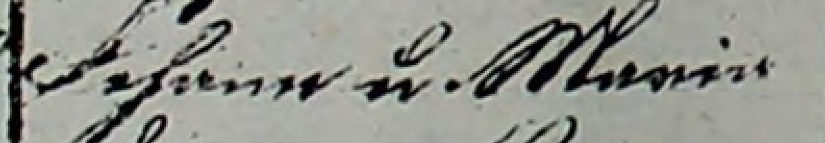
Johann u. Maria
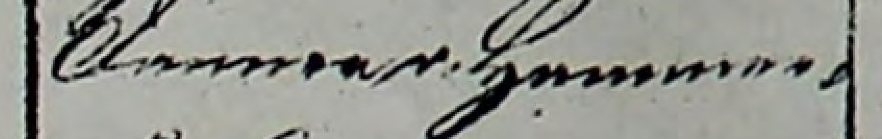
Janner v. Hammer„
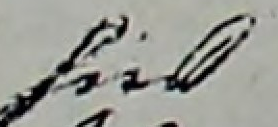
hirs
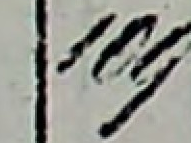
109
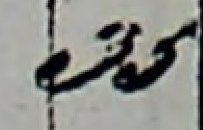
35
